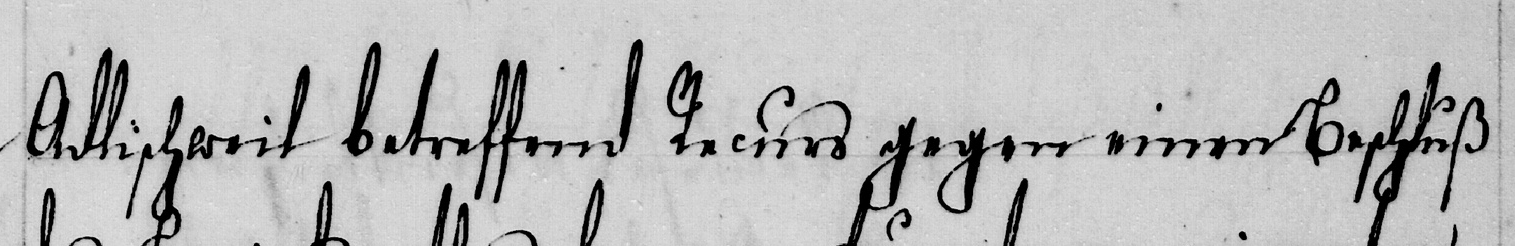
Adlischweil betreffend Recurs gegen einen Beschluß
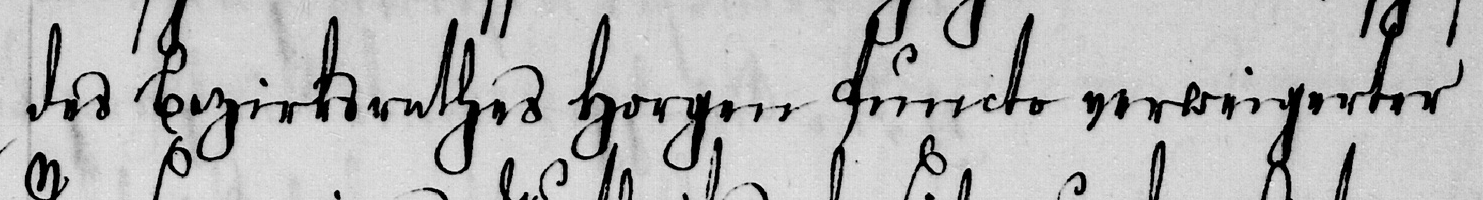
des Bezirksrathes Horgen Puncto verweigerter
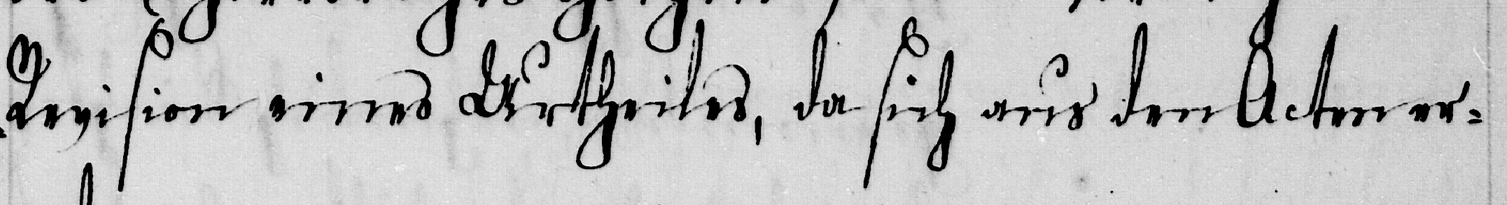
Revision eines Urtheiles, da sich aus den Acten er¬
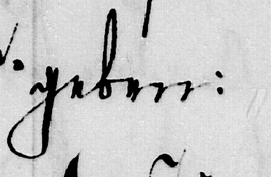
geben:
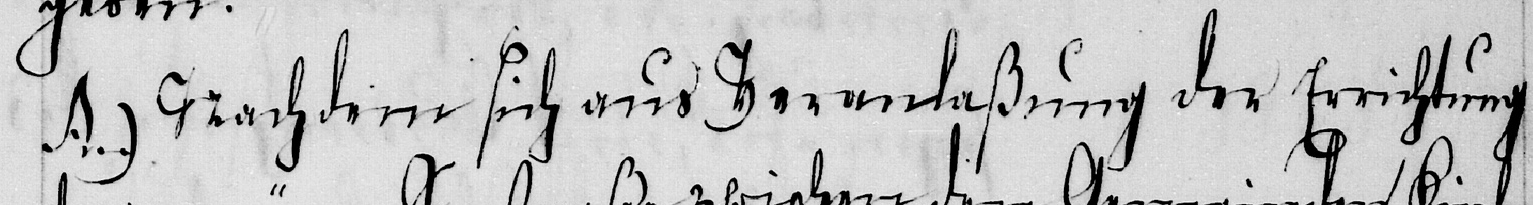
A.) Nachdem sich aus Veranlaßung der Errichtung
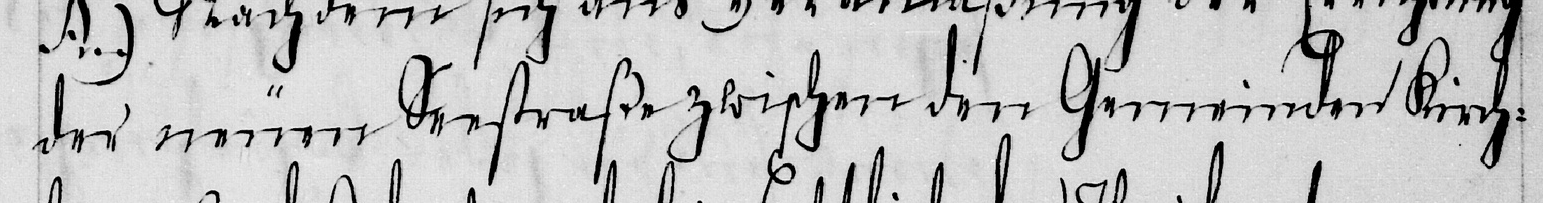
der neuen Seestraße zwischen den Gemeinden Kirch¬
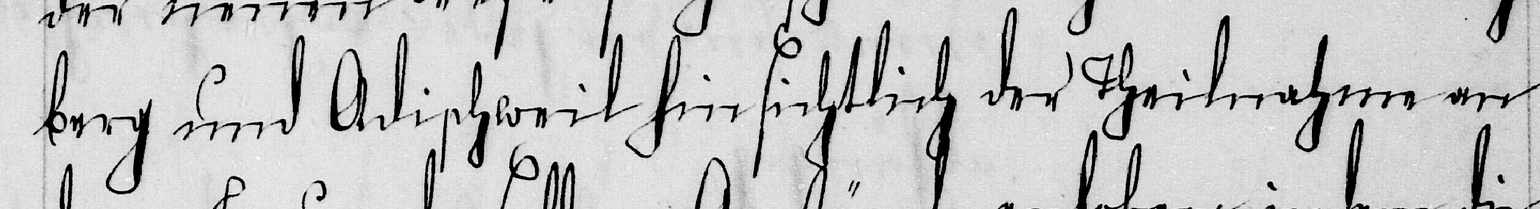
berg und Adlischweil hinsichtlich der Theilnahme an
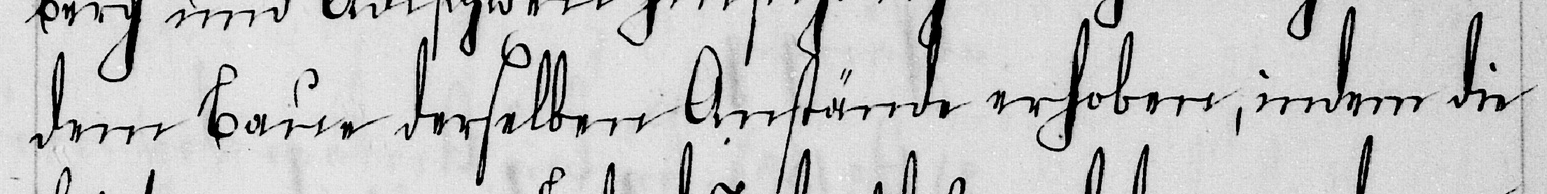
dem Baue derselben Anstände erhoben, indem die
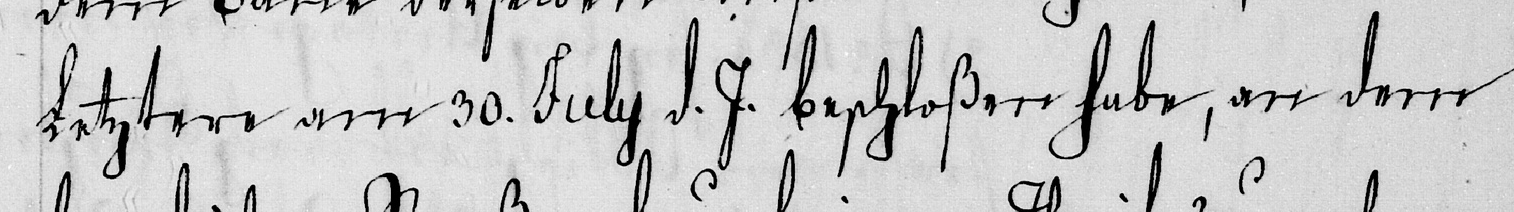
Letztere am 30. July d. J. beschloßen habe, an dem
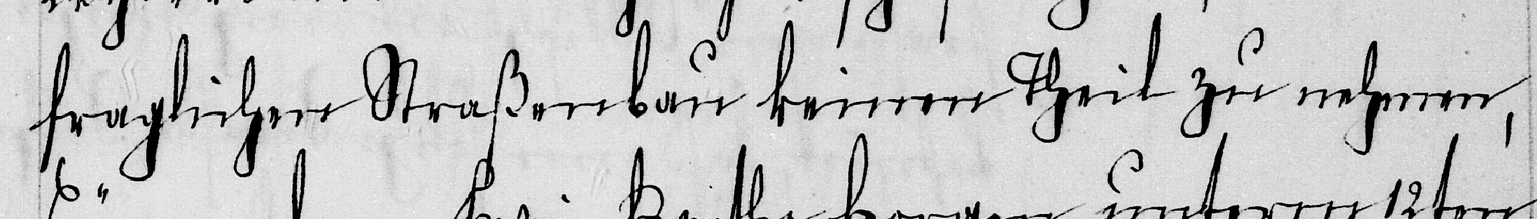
fraglichen Straßenbau keinen Theil zu nehmen,
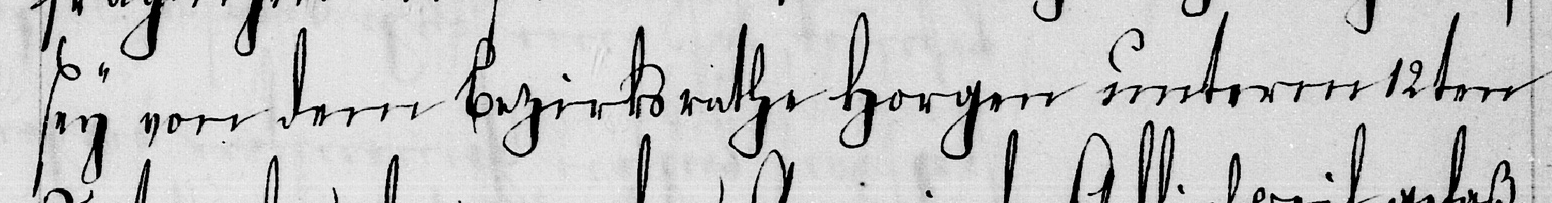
sey von dem Bezirksrathe Horgen unterm 12ten
